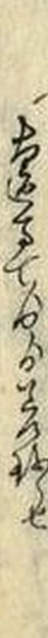大道寺七右衛門ゟ差越候由
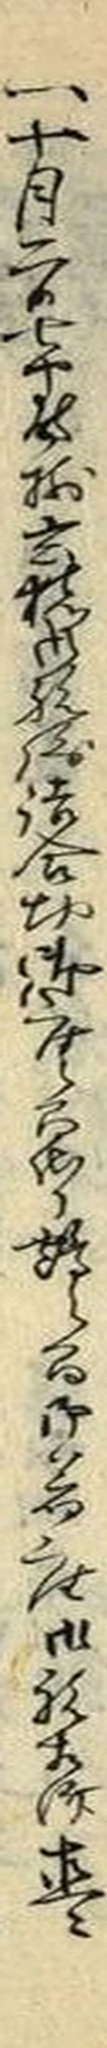一十月二日七半時揃玄猪御祝儀詰合切御座之間代り鶴之間御着座御祝相済直々
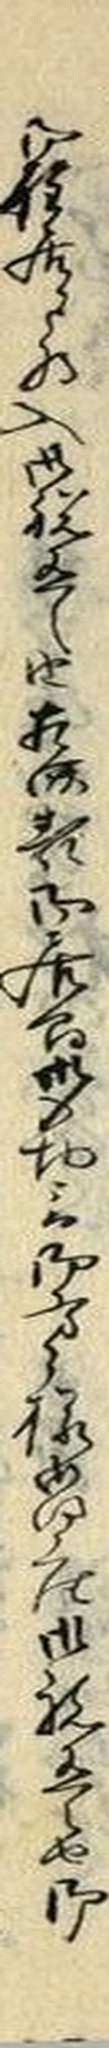御住居へ被為入御祝有之候由相済表御居間御〆切ニ而御方々様御同座御祝有之候由御
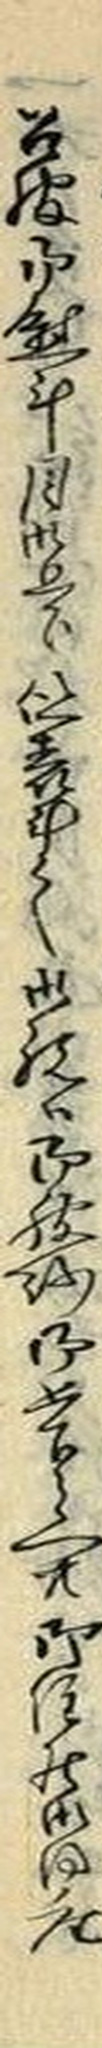召服御熨斗目御上下但表斗之御祝ハ御服紗御上下ニ候へ共御住居御同座
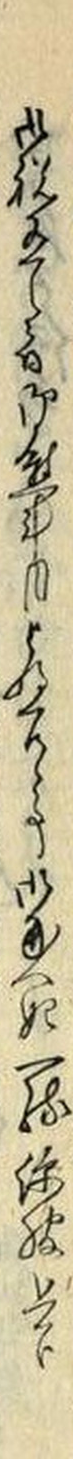御祝有之候ニ付御熨斗目被為召候事御用人始一統綿服上下
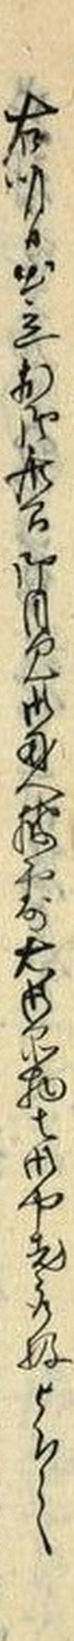右明日出立於御居間御目見御用人披露右御品物は御中老取扱被下之
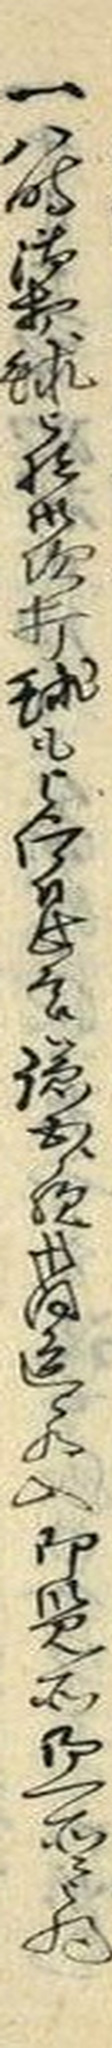一八時御打毬被遊御次打毬も被仰付此節謙五郎様御同道被為入御覧所御一所ニ被為
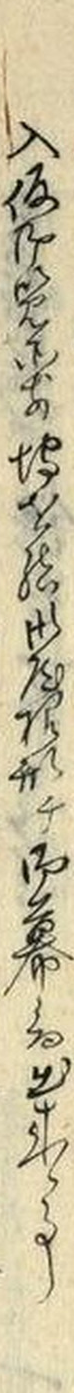入仮御覧所前坡を結御屋根形チ御幕ニ而出来候事
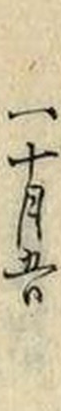一十月朔日
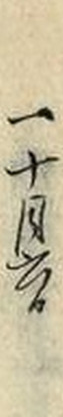一十月朔日
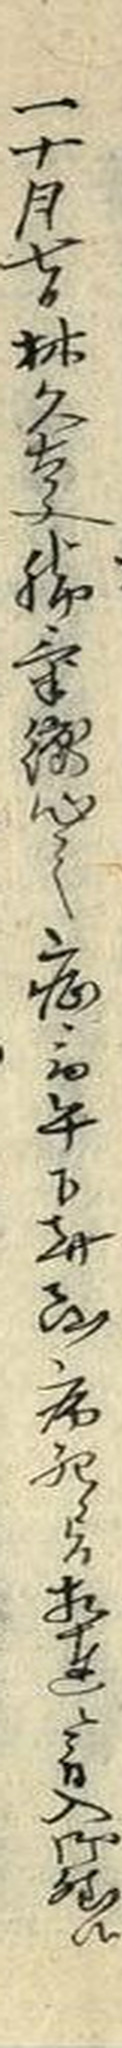一十月七日林久太夫脚気衝心之病ニ而午下刻致病死候旨相達候ニ付入御聴候
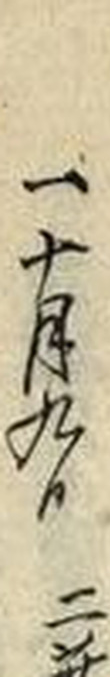一十月九日
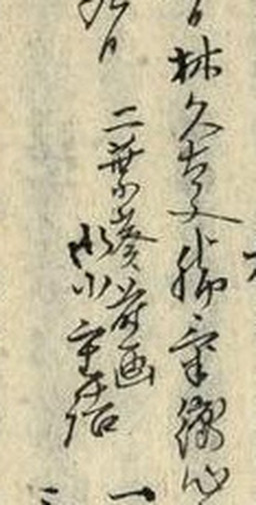二葉葵蒔画
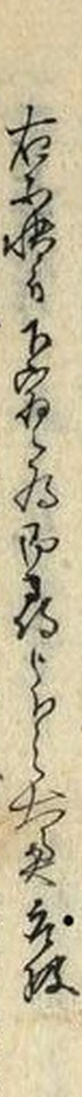右不快ニ付下宿へ被為御尋被下之大奥取扱
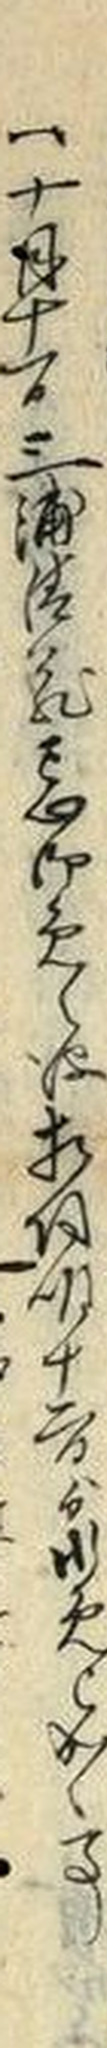一十月十一日三浦清蔵忌御免之儀相伺明十二日ゟ御免被成候事
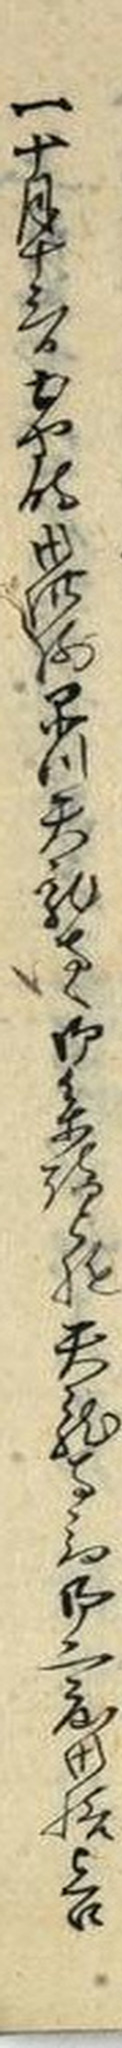一十月十三日五半時御供揃品川天龍寺へ御参詣被遊天龍寺ニ而御二度御膳被召
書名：少傅日録抄（斉承付側向頭取日記、在府）
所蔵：福井県文書館 Fukui Prefectural Archives
